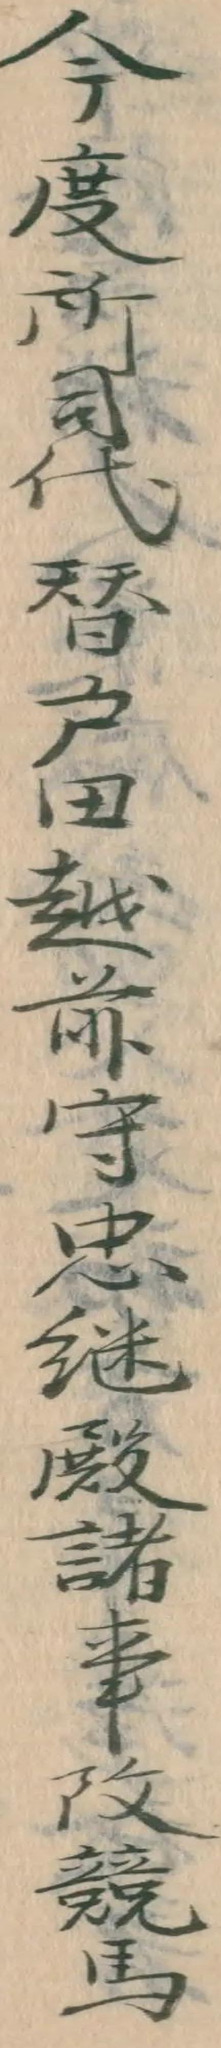今度所司代替戸田越前守忠継殿諸事改競馬
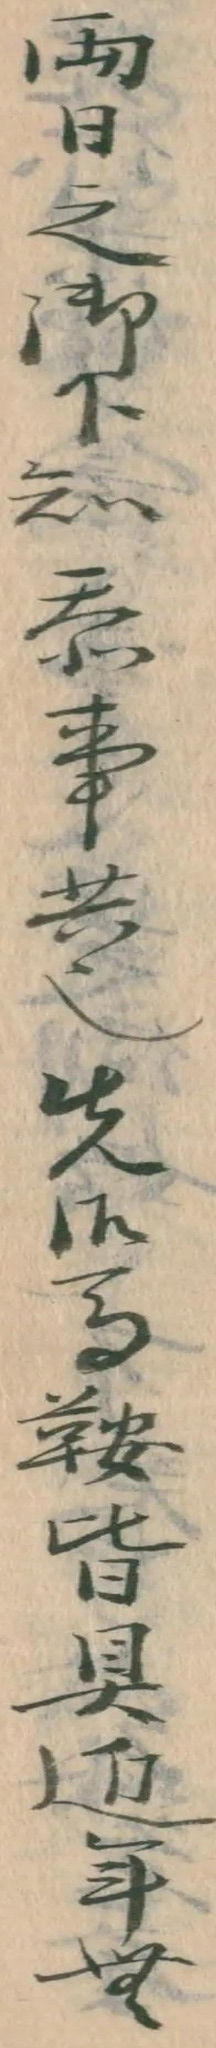両日之御下知参事共也先御馬鞍皆具近年無
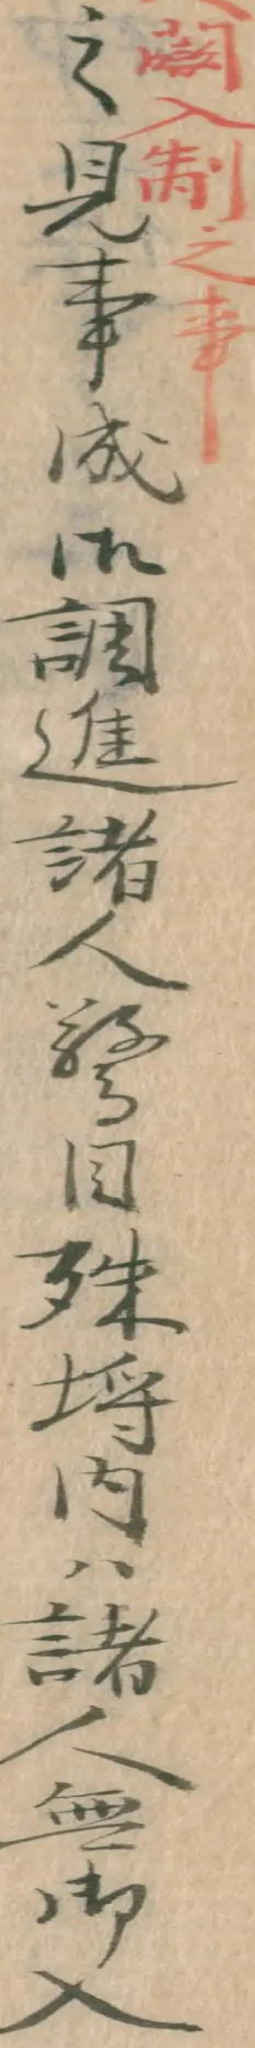之見事成御調進諸人驚目殊埒内ハ諸人無御入
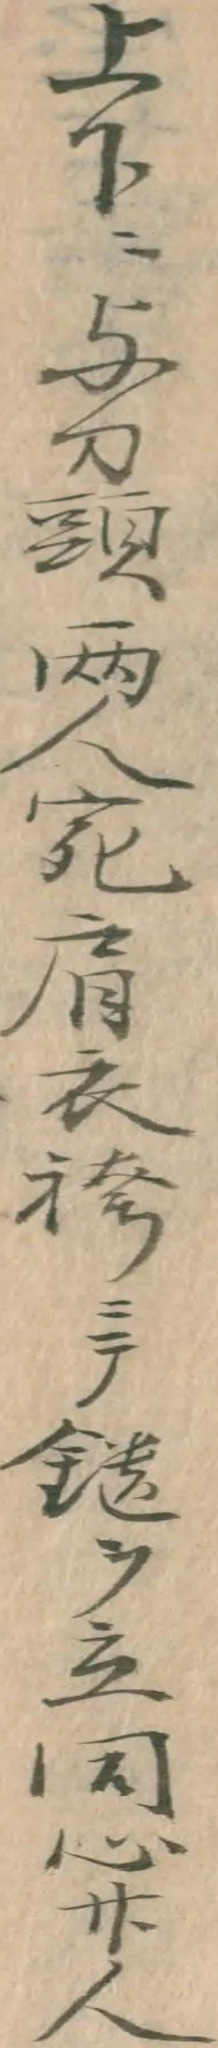上下ニ与刀頭両人宛肩衣袴ニテ鑓ヲ立同心廿人
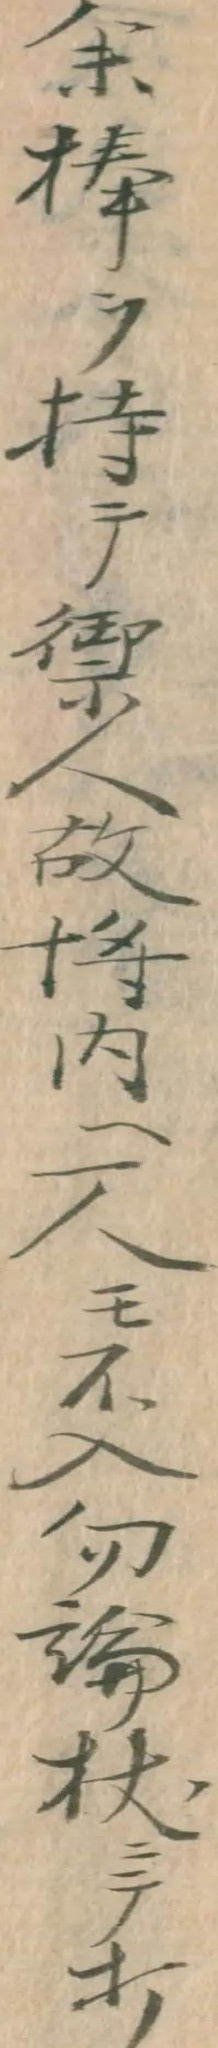余棒ヲ持テ禦人故埒内ヘ一人モ不入勿論杖ニテ打
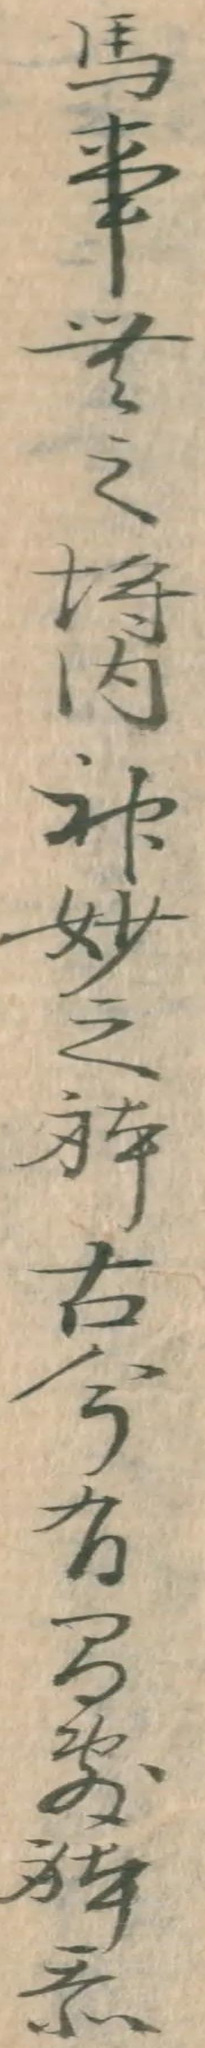馬事無之埒内神妙之体古今有間敷体忝
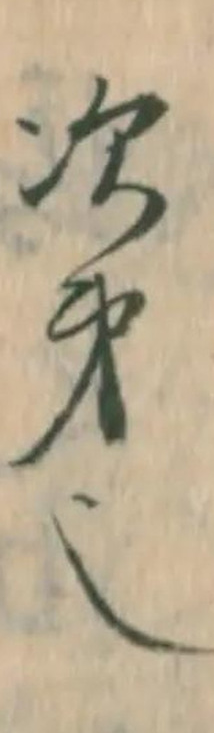次第也
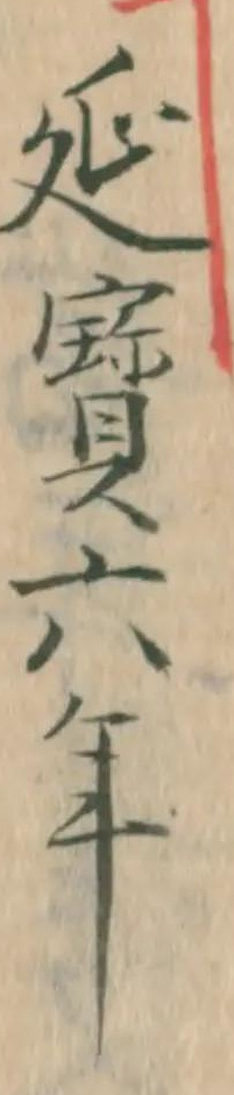延宝六年
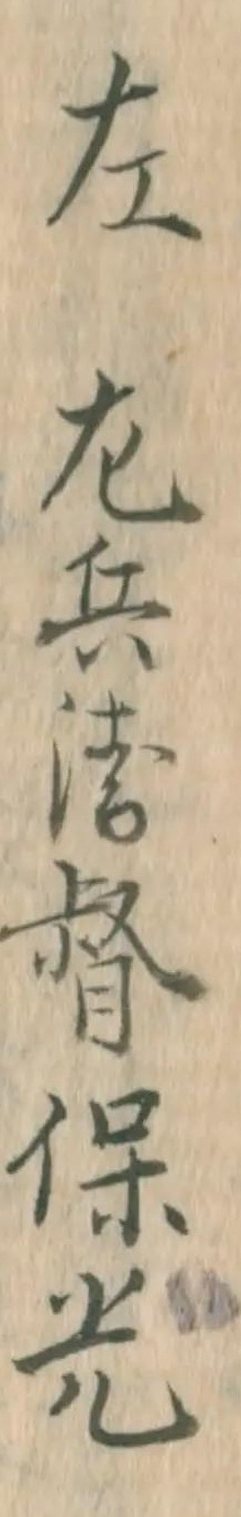左左兵衛督保光
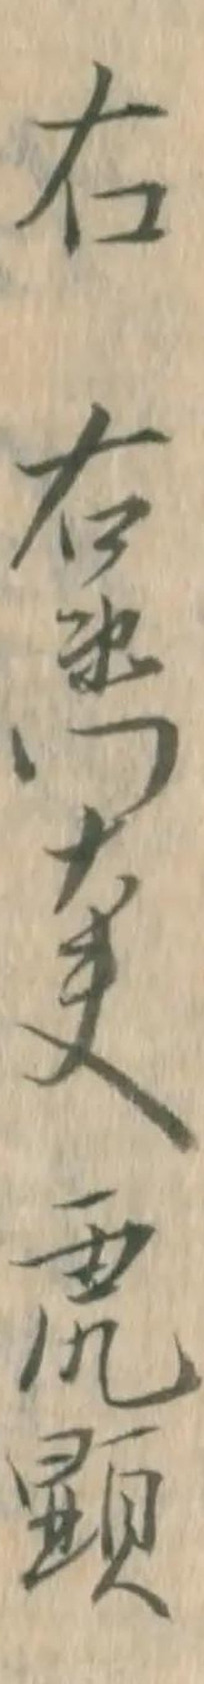右右衛門大夫虎顕
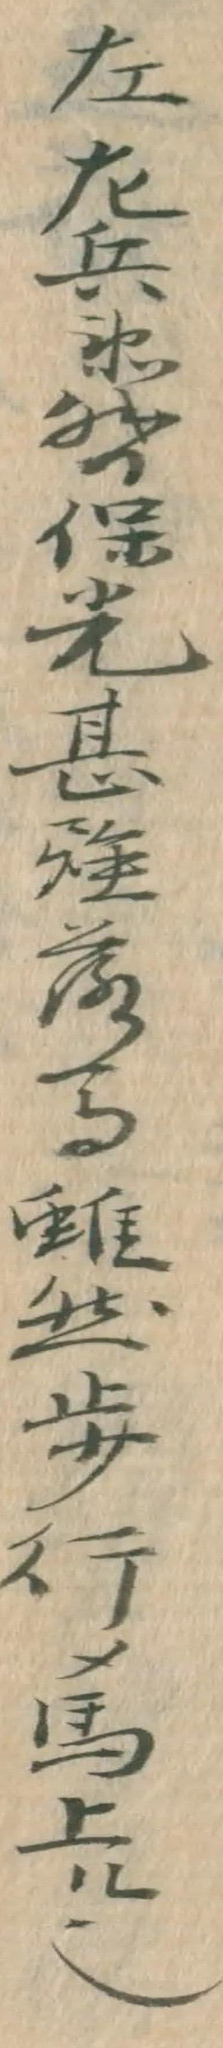左左兵衛督保光甚強落馬雖然歩行シテ馬上ル也
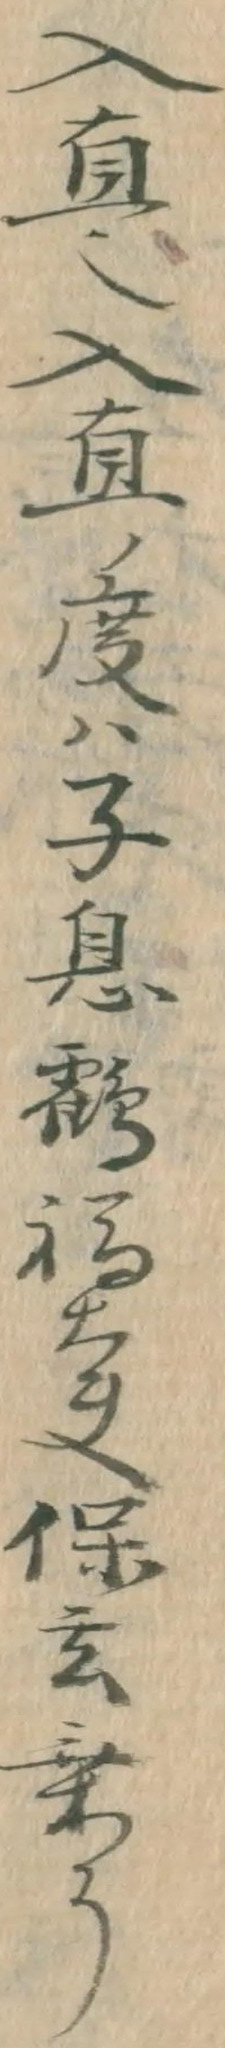入直也入直ノ度ハ子息鶴福大夫保玄乗了

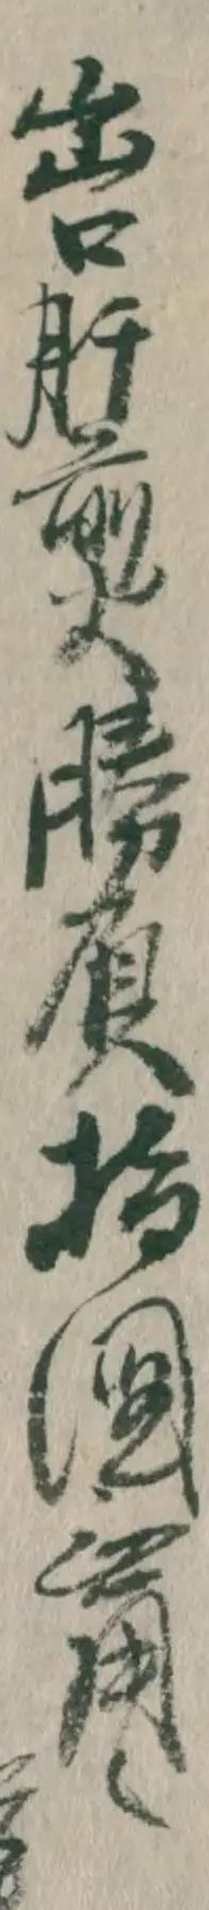出口肝煎勝負指図無用之
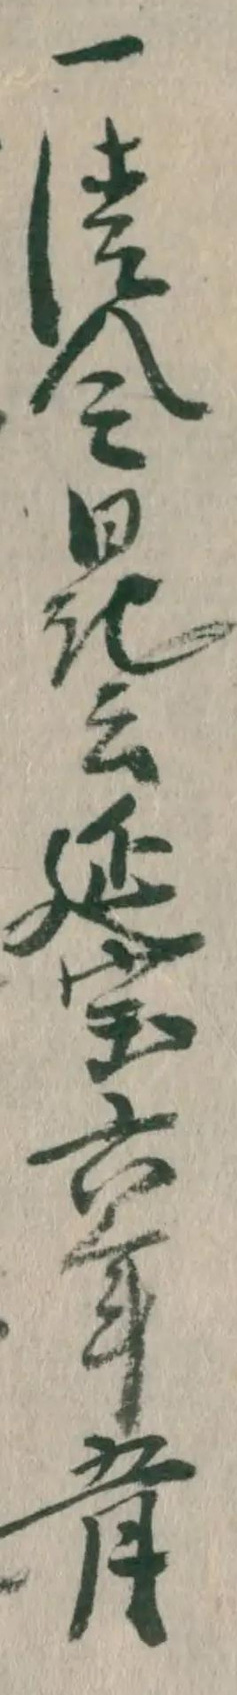一清令日記云延宝六年五月
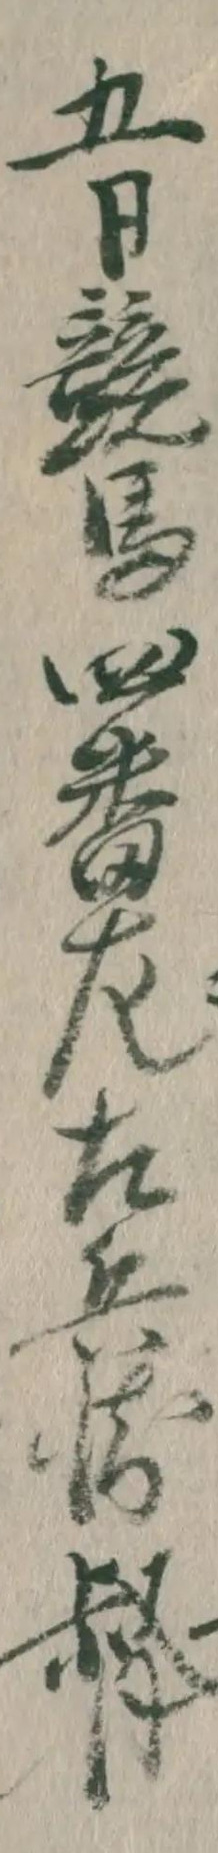五日競馬四番左左兵衛督
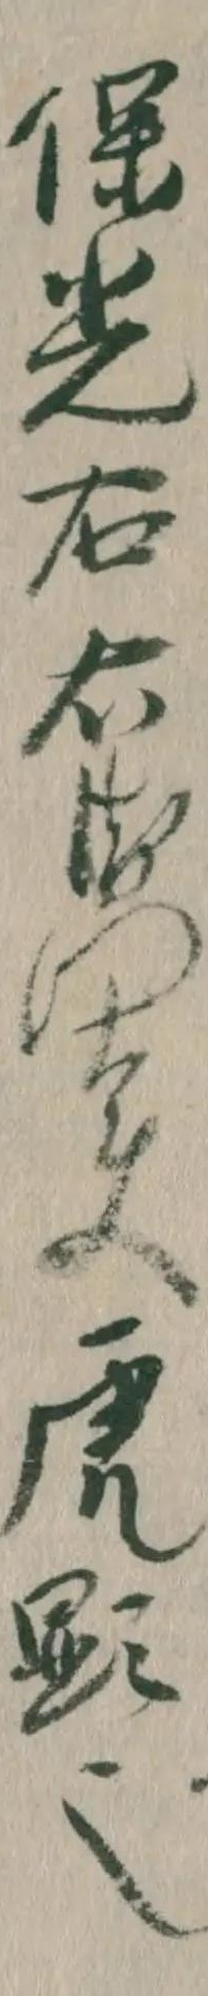保光右右衛門大夫虎顕也
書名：賀茂社記録. 第10冊
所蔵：国立国会図書館 National Diet Library, JAPAN
